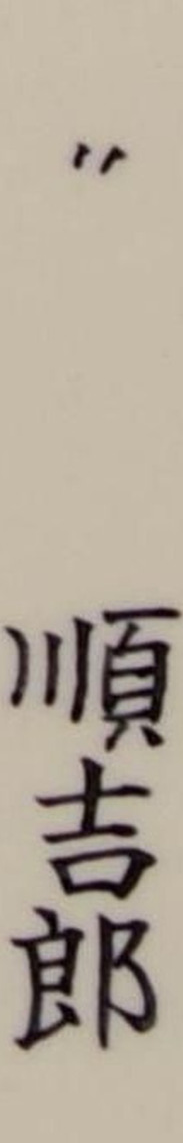順吉郎
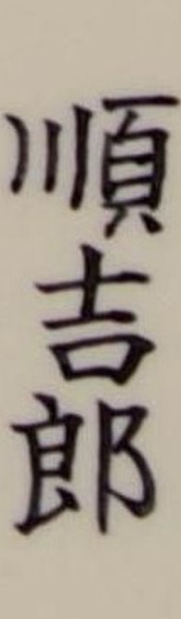順吉郎
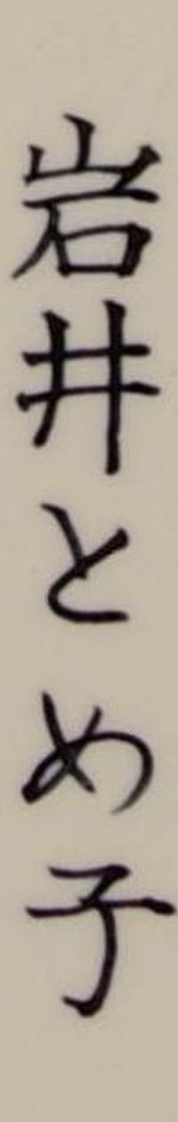岩井とめ子
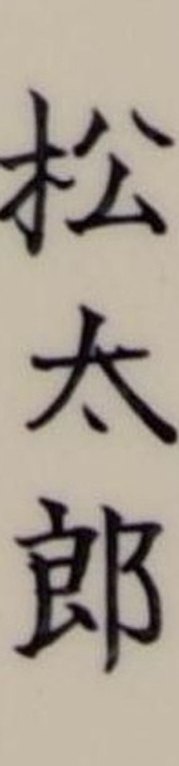松太郎
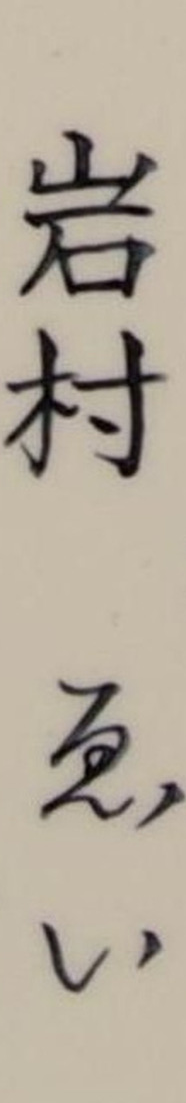岩村えい
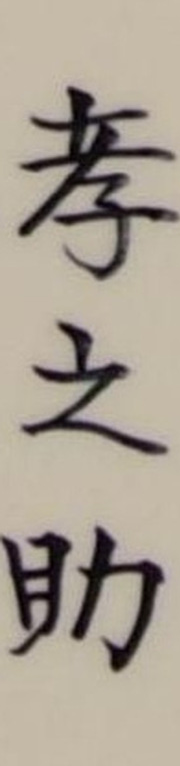孝之助
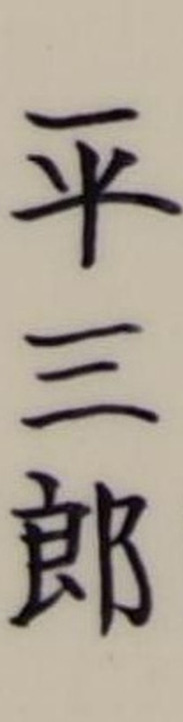平三郎
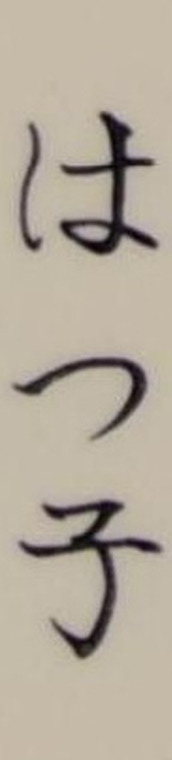はつ子
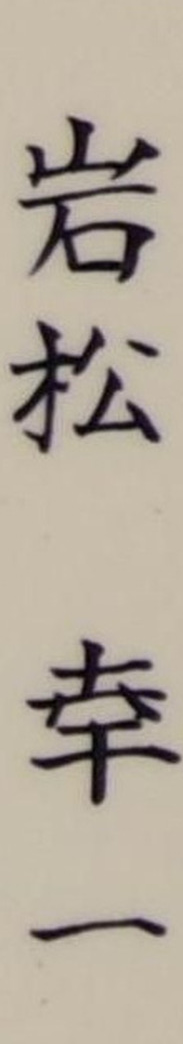岩松幸一
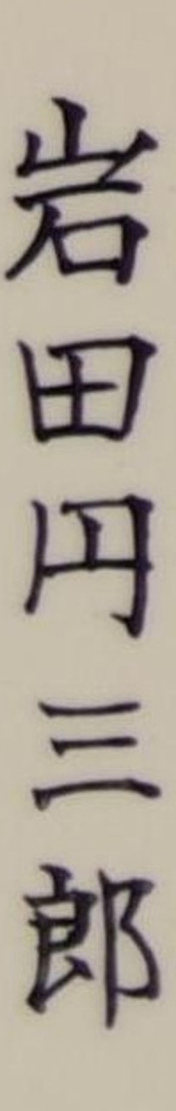岩田円三郎
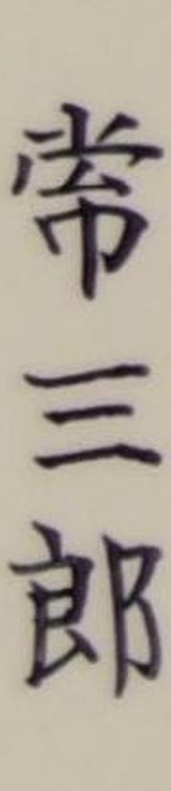常三郎

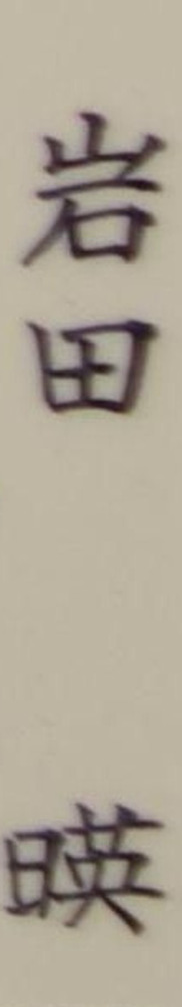岩田暎
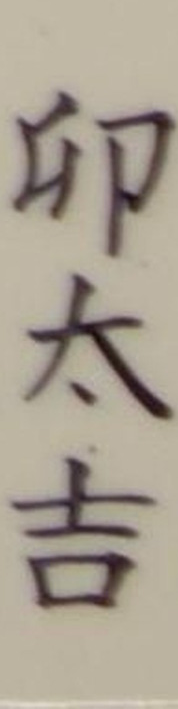卯太吉
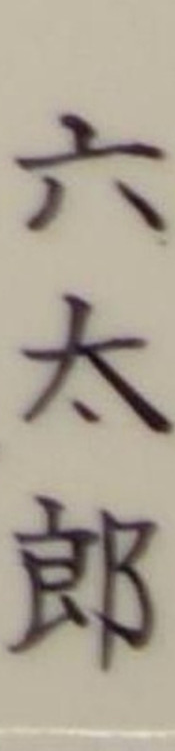六太郎
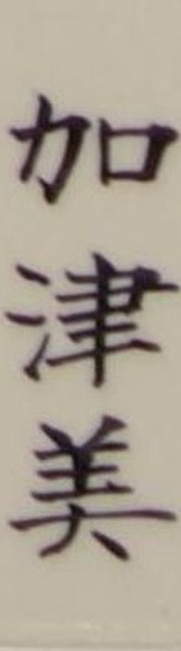加津美
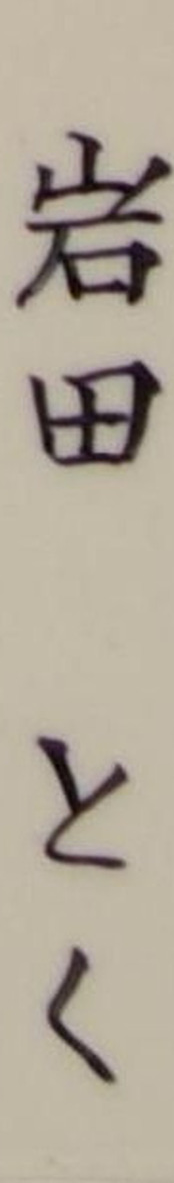岩田とく
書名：M~S
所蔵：高野山金剛峯寺
